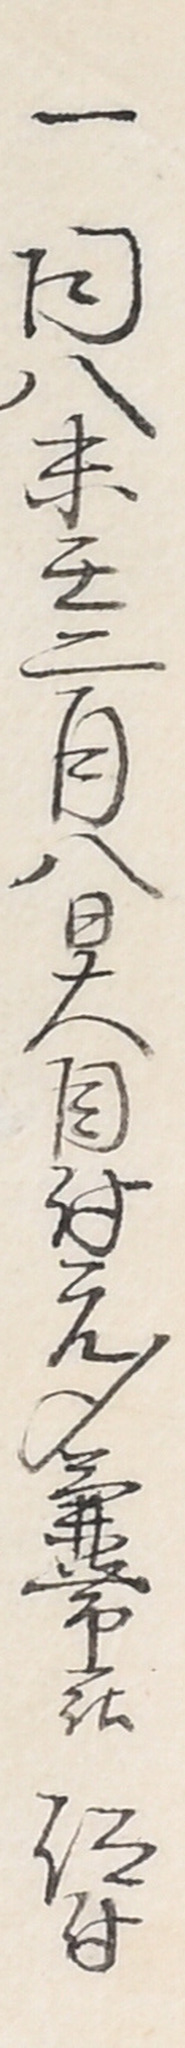一同八未閏二月八日大目付元〆兼帯被仰付
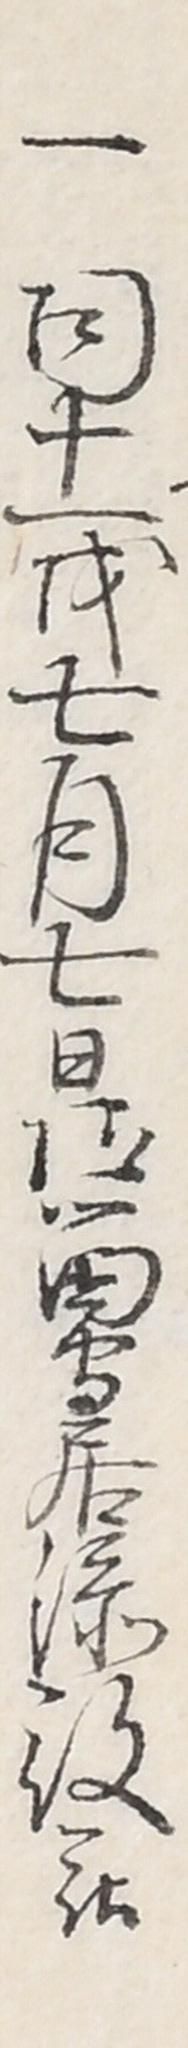一同十一戌七月七日御留守居添役被
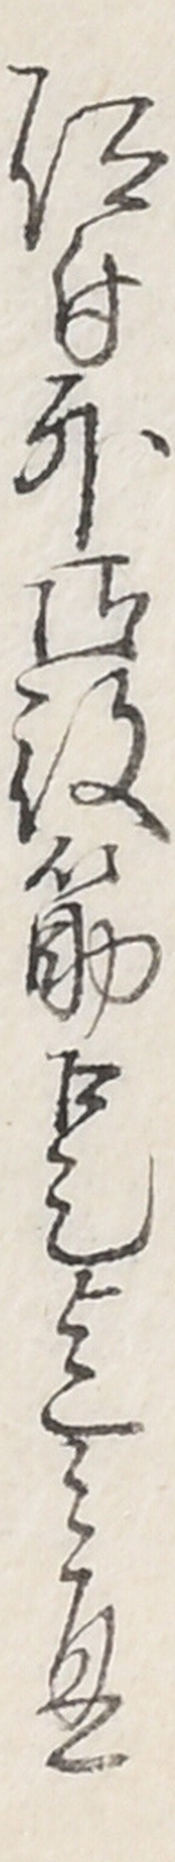仰付外御役筋是迄之通
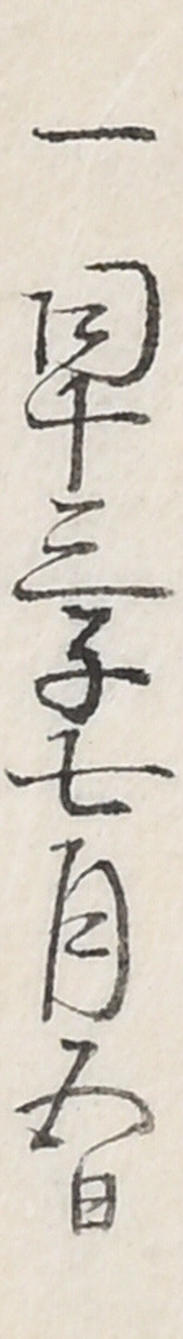一同十三子七月五日
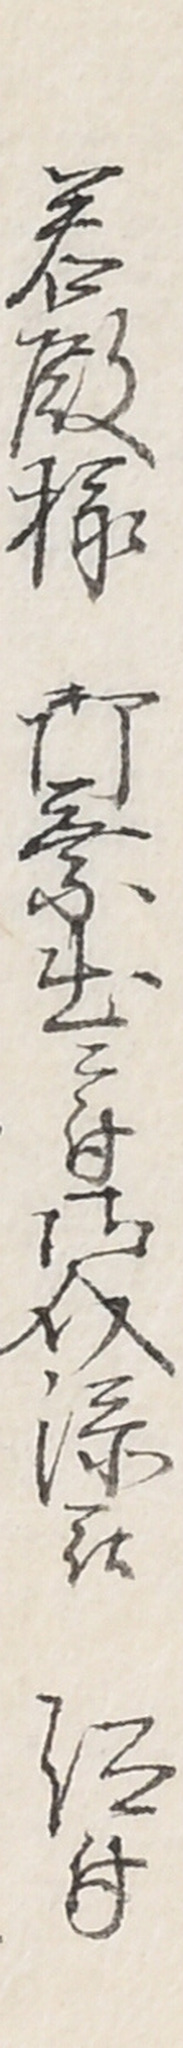若殿様御乗出ニ付御介添被仰付
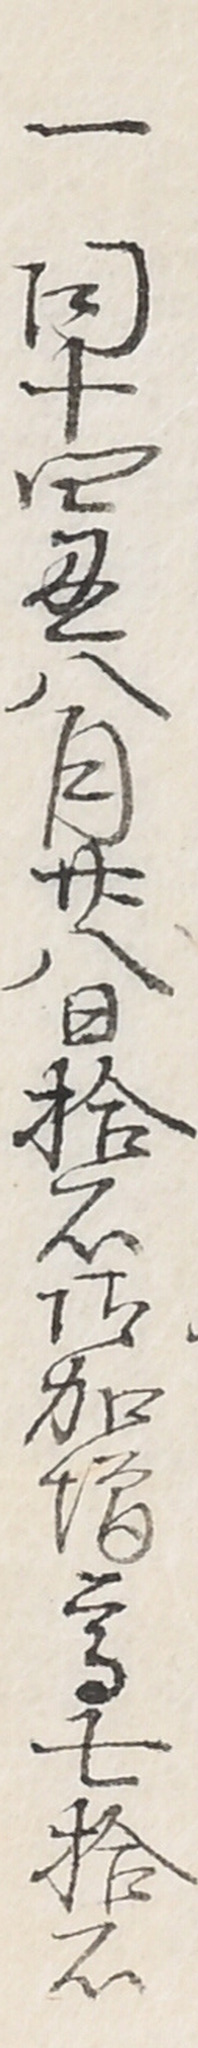一同十四丑八月廿八日拾石御加増高七拾石
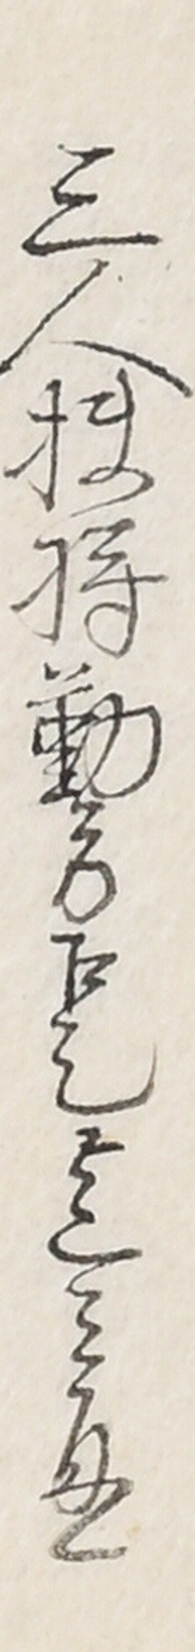三人扶持勤方是迄之通
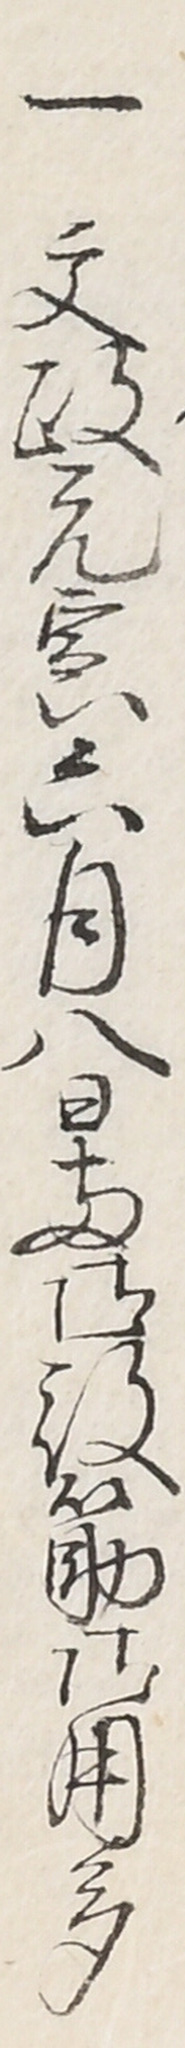一文政元寅六月八日両御役筋御用多
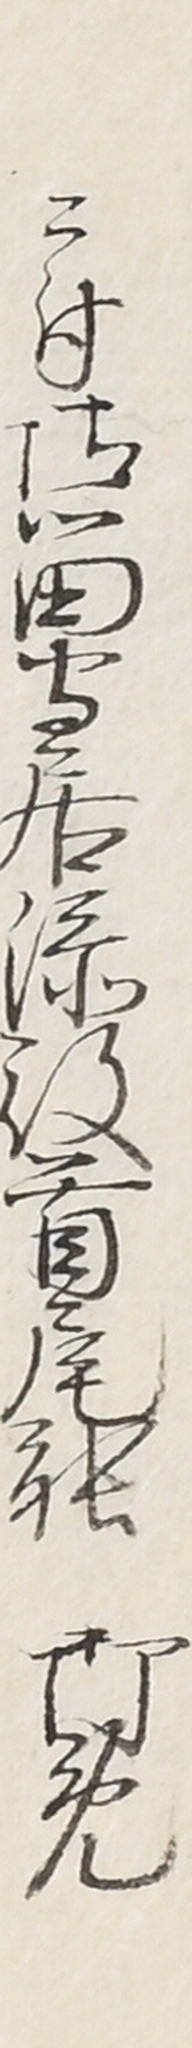ニ付御留守居添役首尾能御免
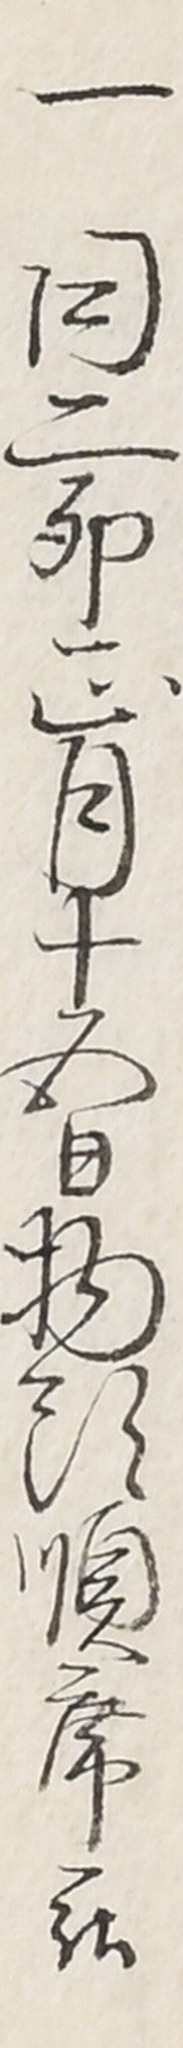一同二卯正月十五日物頭順席被
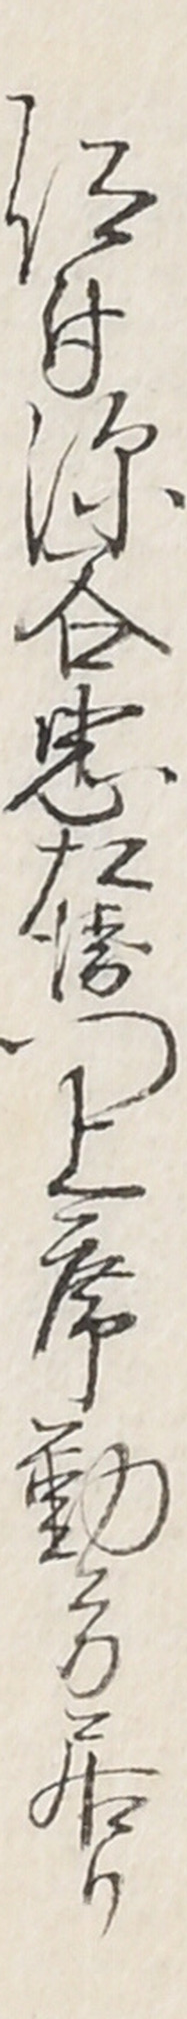仰付深谷忠左衛門上席勤方居候
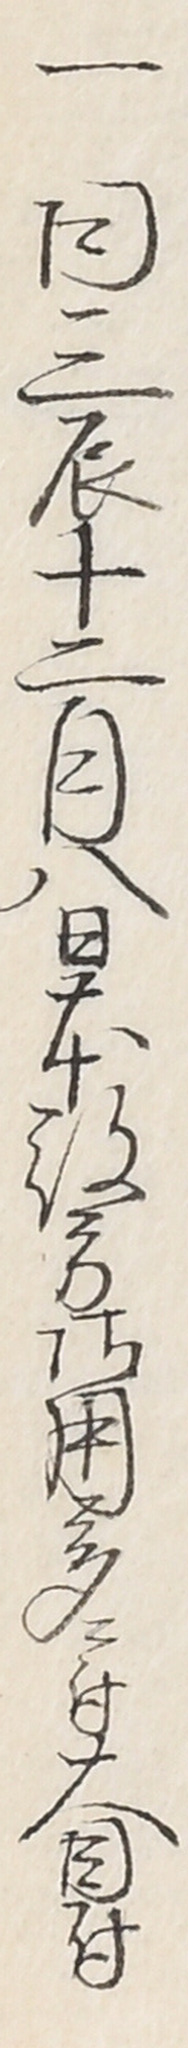一同三辰十二月八日本役方御用多ニ付大目付
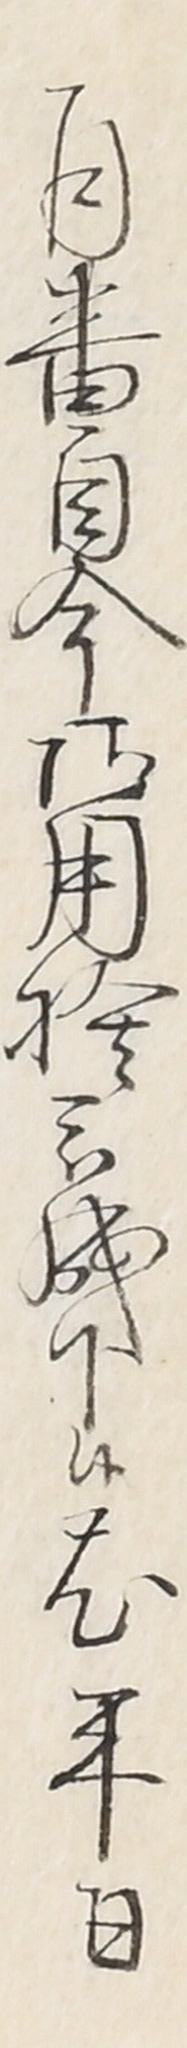月番自今御用捨被成下候尤平日
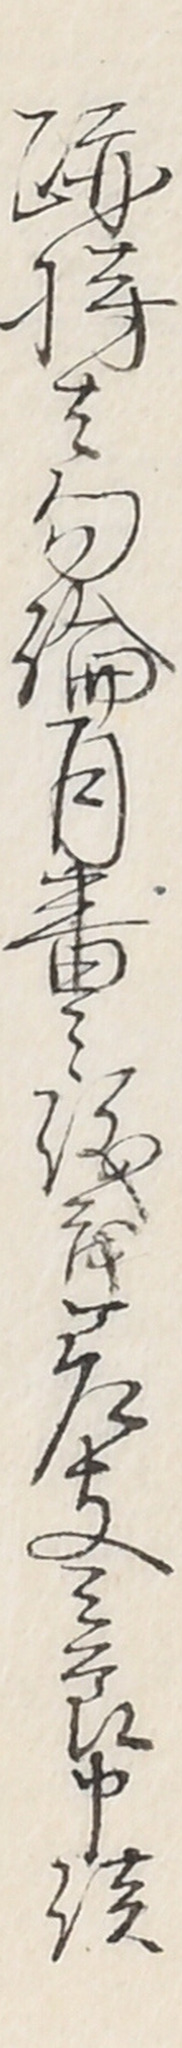跡持は勿論月番之儀も差支之節申談
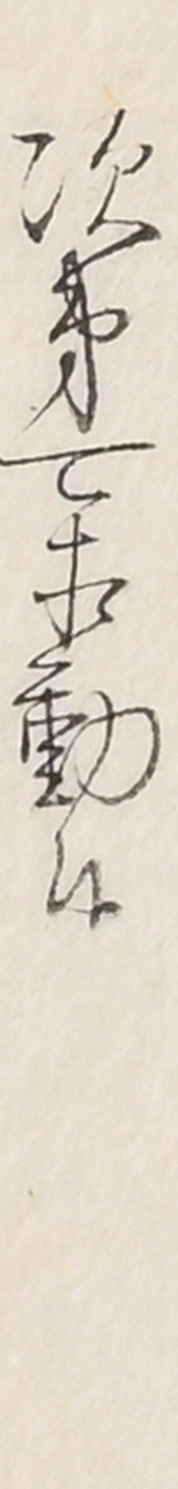次第可相勤候
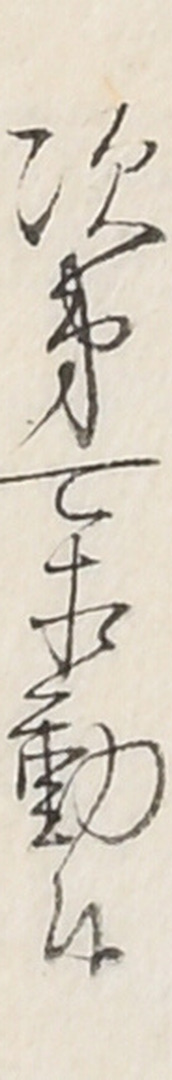次第可相勤候
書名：給人諸士勤仕録（七）
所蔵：伊那市立高遠町図書館・合同会社AMANE
